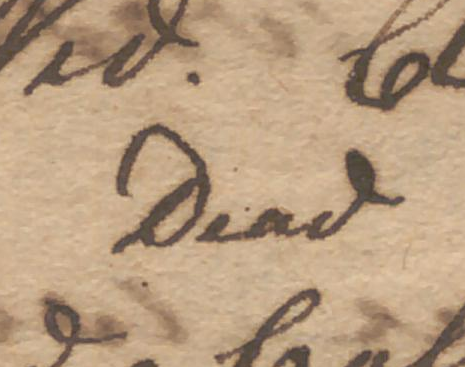Dead
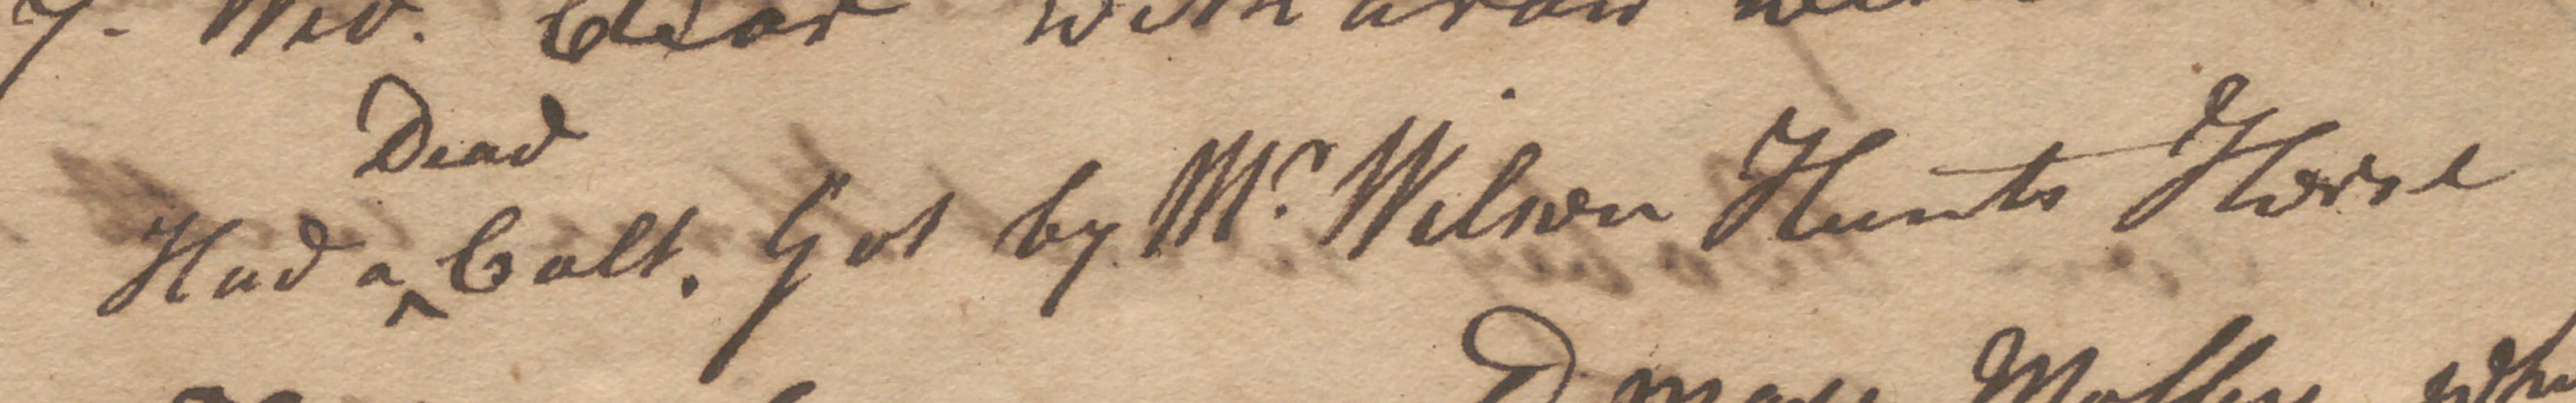Had a ^ Colt. Got by M^r. Wilwer Hunts Horse
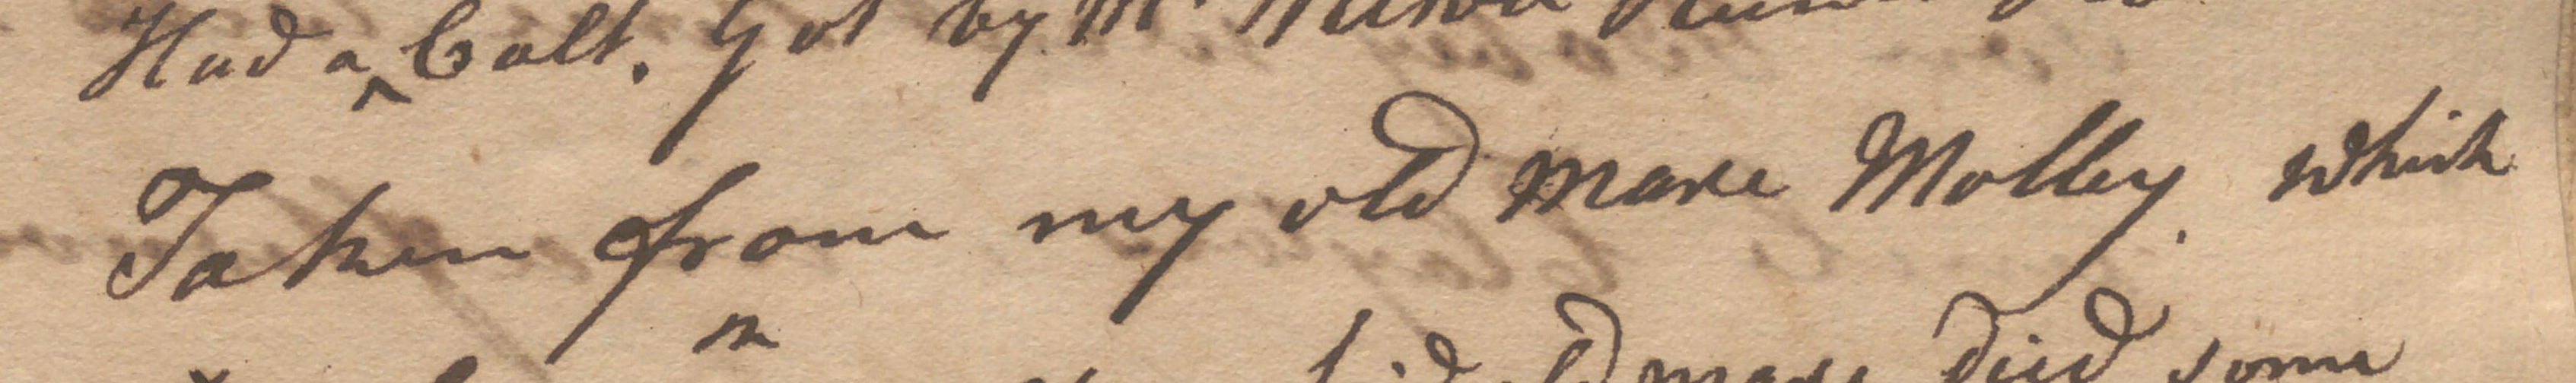Taken ffrom my old mare Molley which
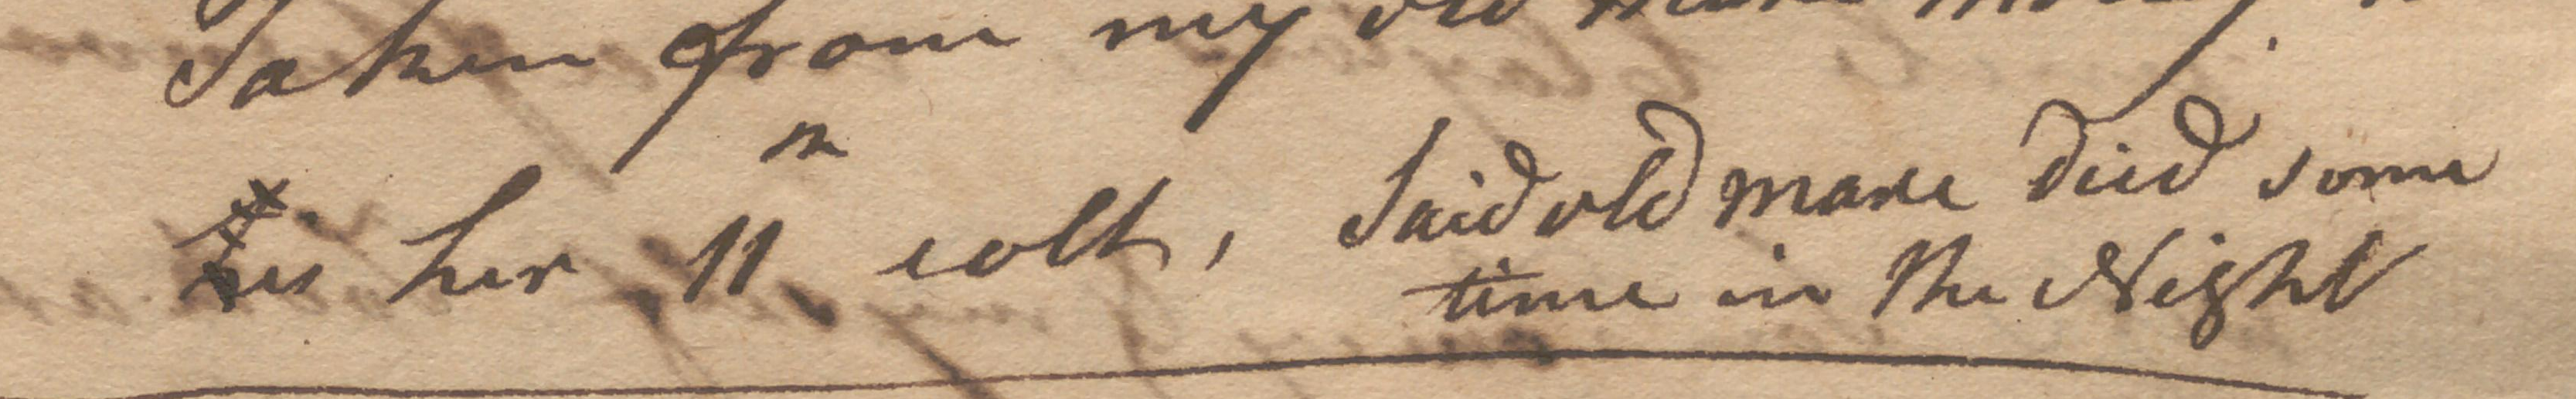[h\is her 11^th colt, said old mare died some
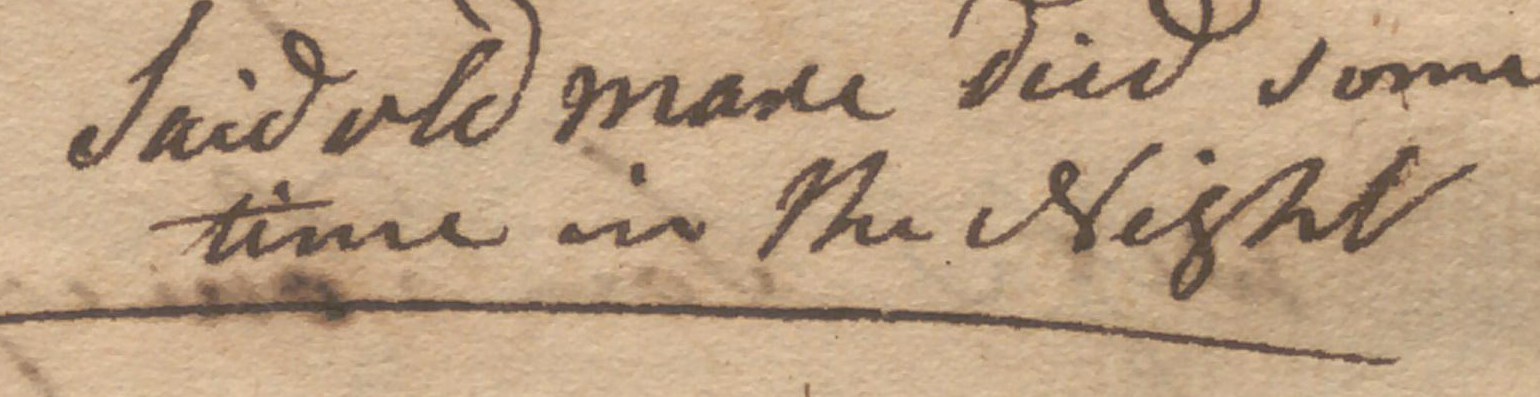time in the Night
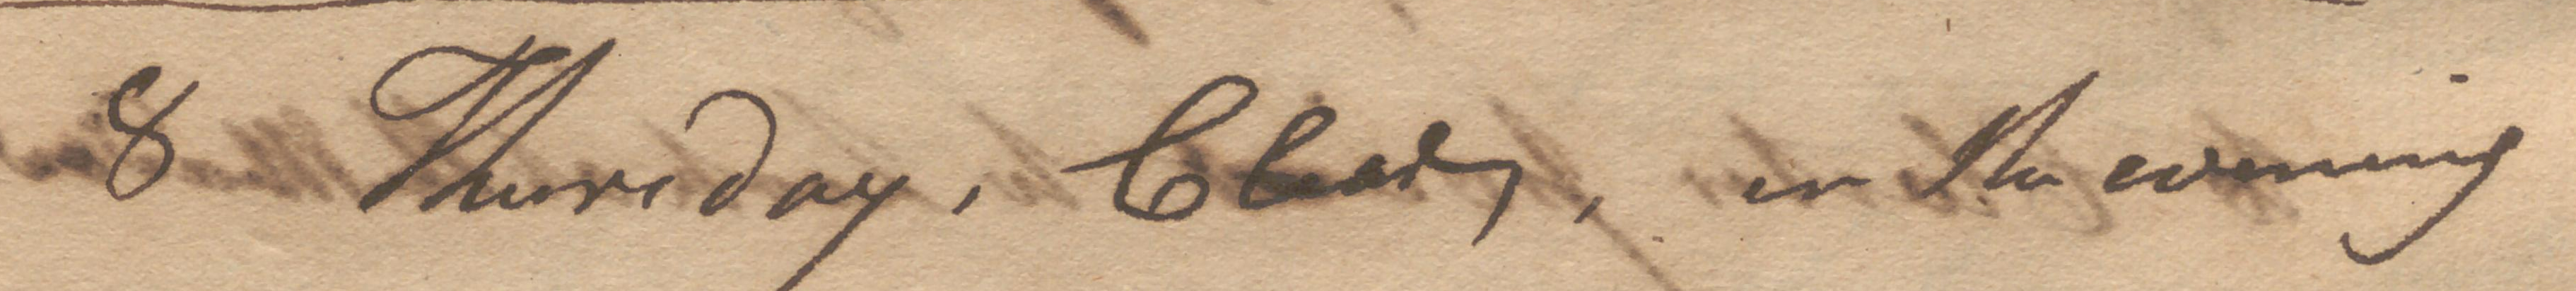8 Thursday. Clear, in the evening
